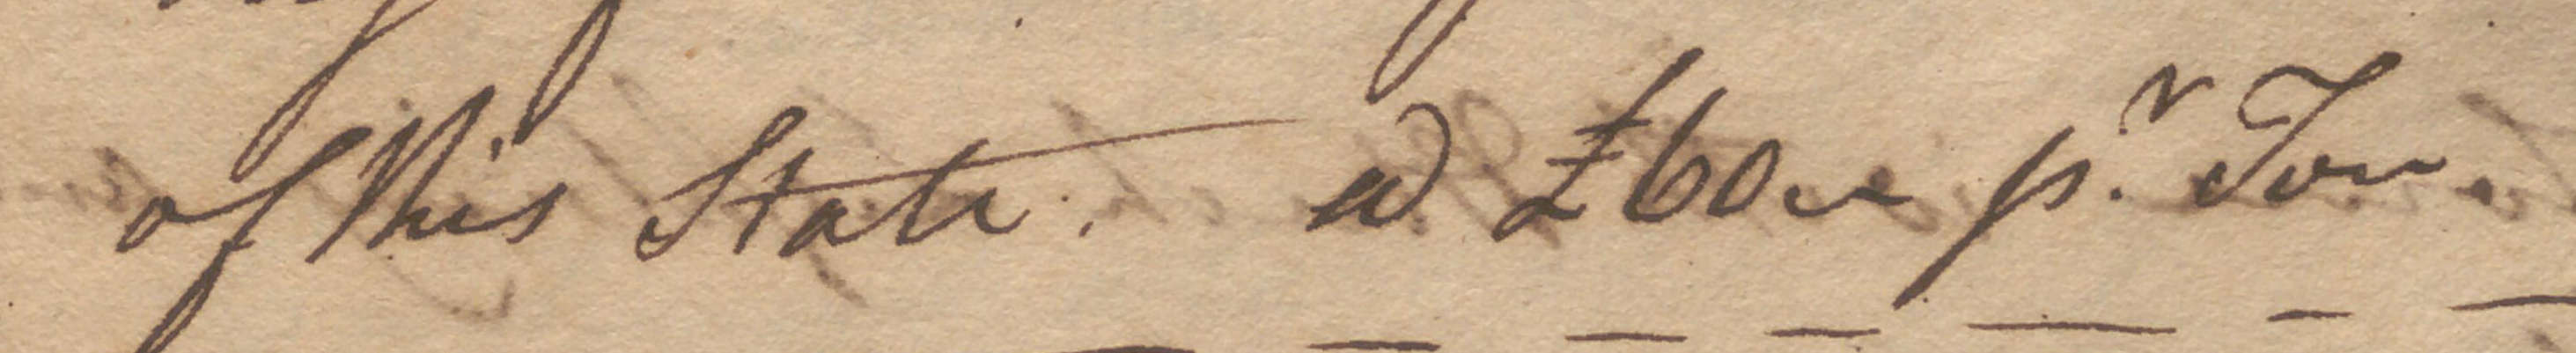of this State- @ £60- p^r. Ton
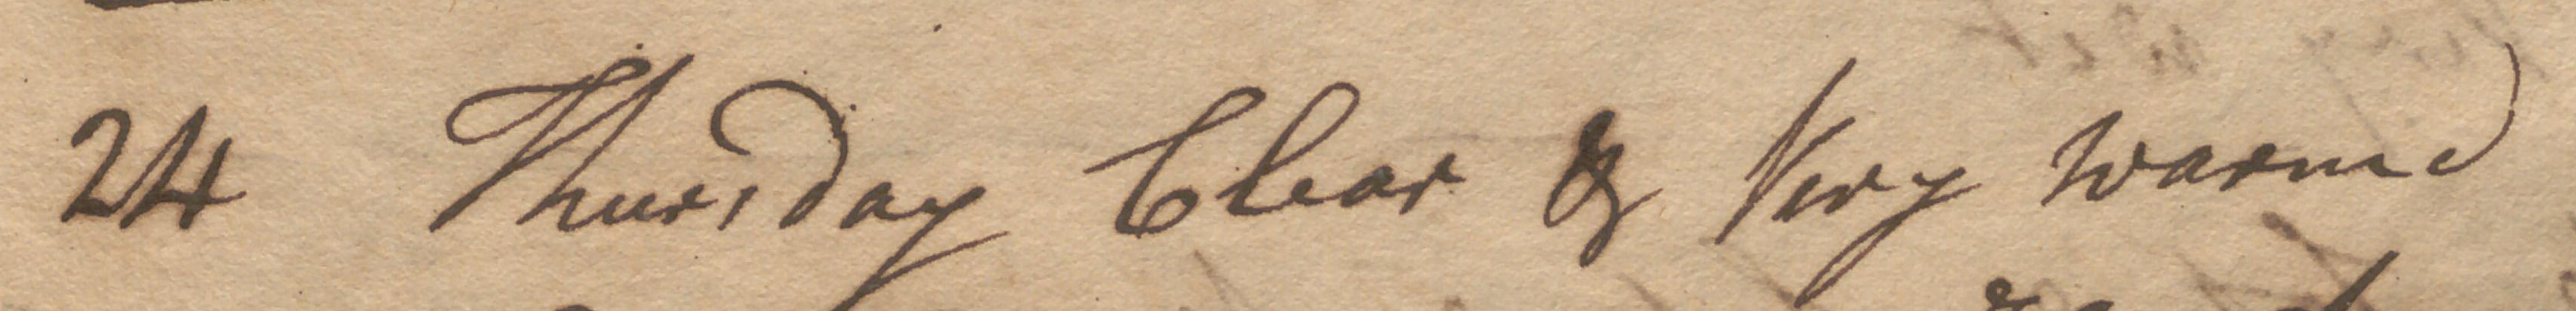24 Thursday Clear & Very warme
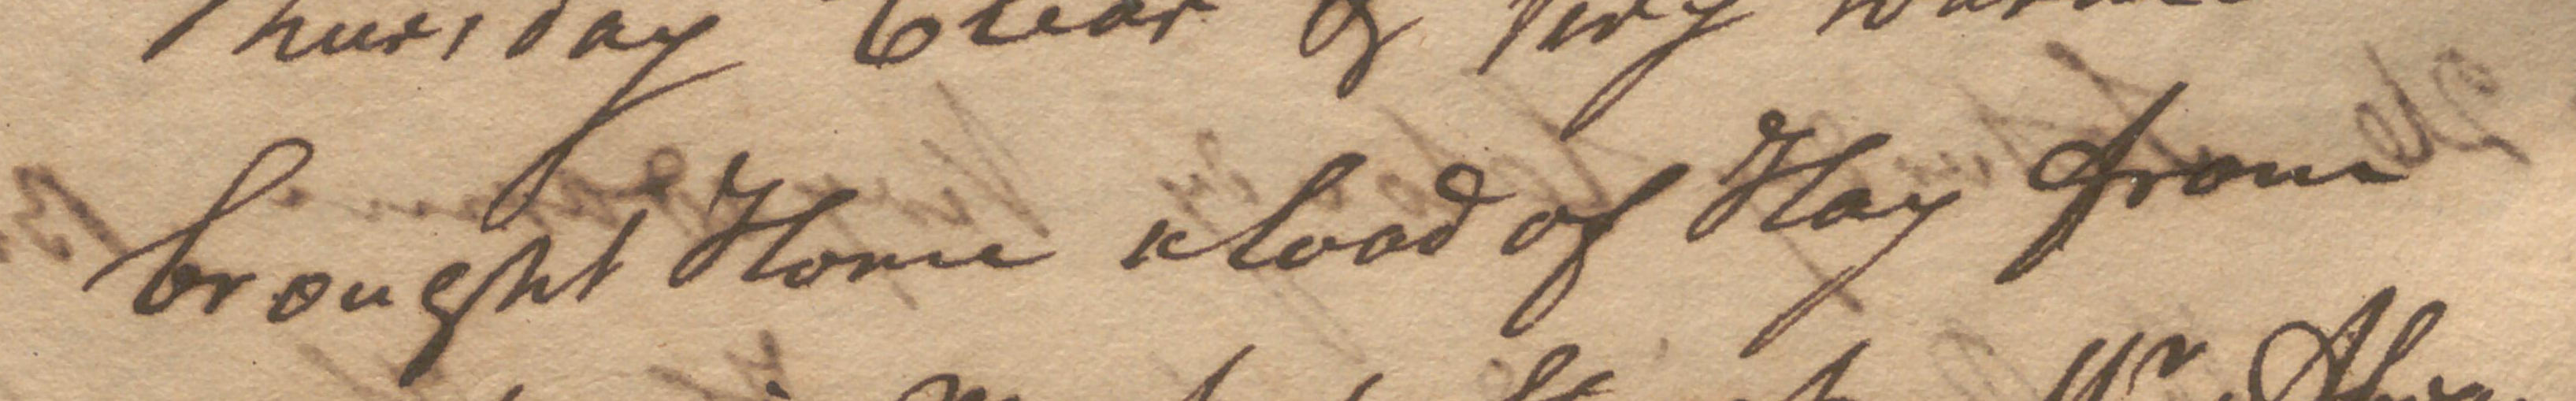brought Home a load of Hay from
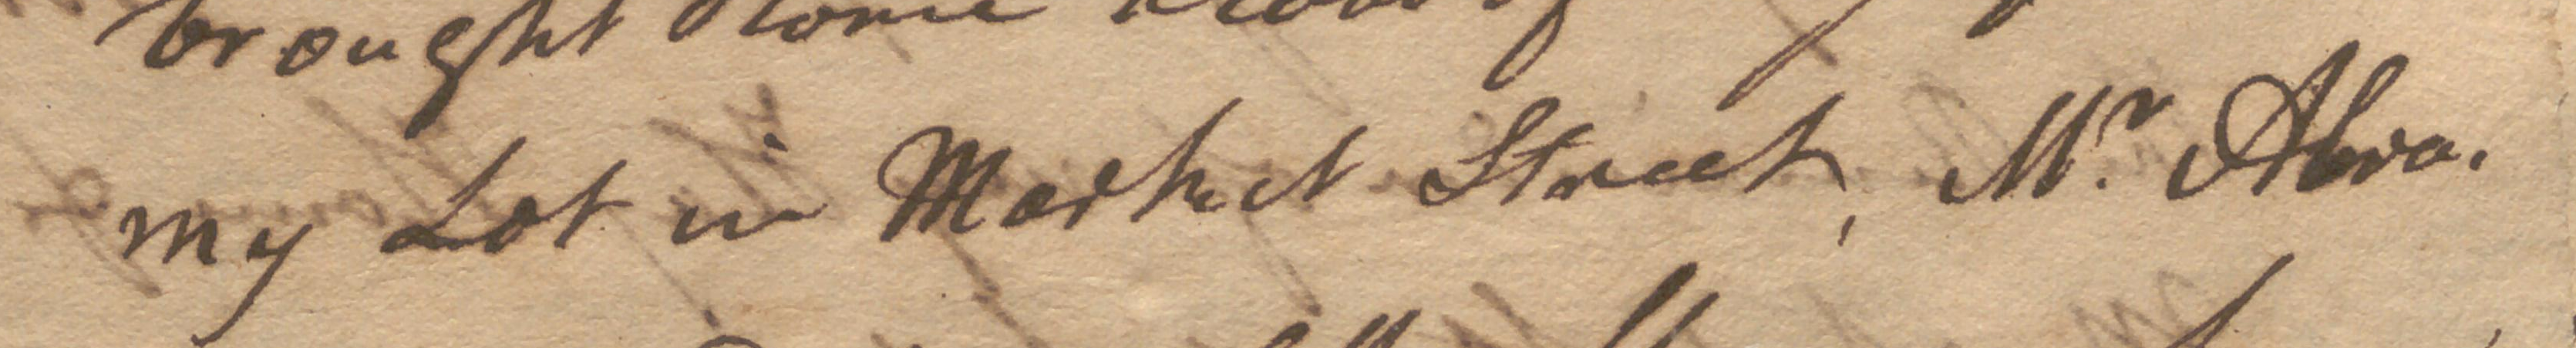my Lot in Market Street M^r. Abra.
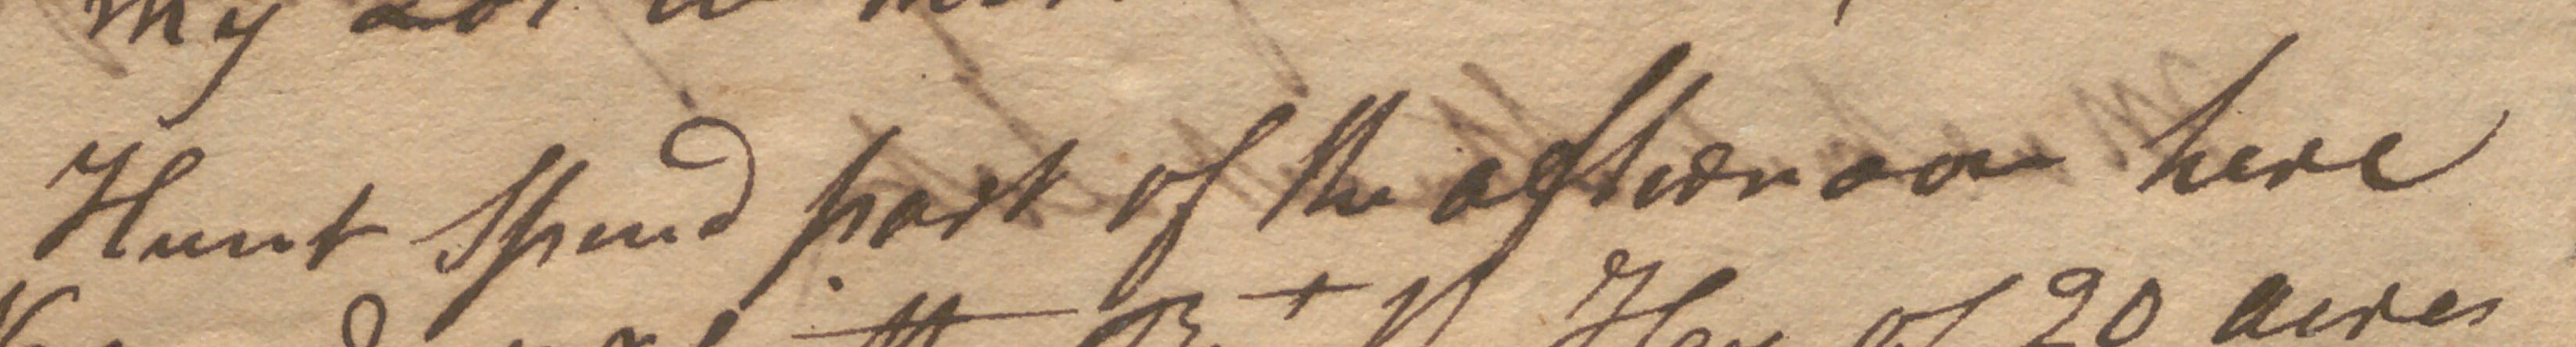Hunt spend past of the afternoon here
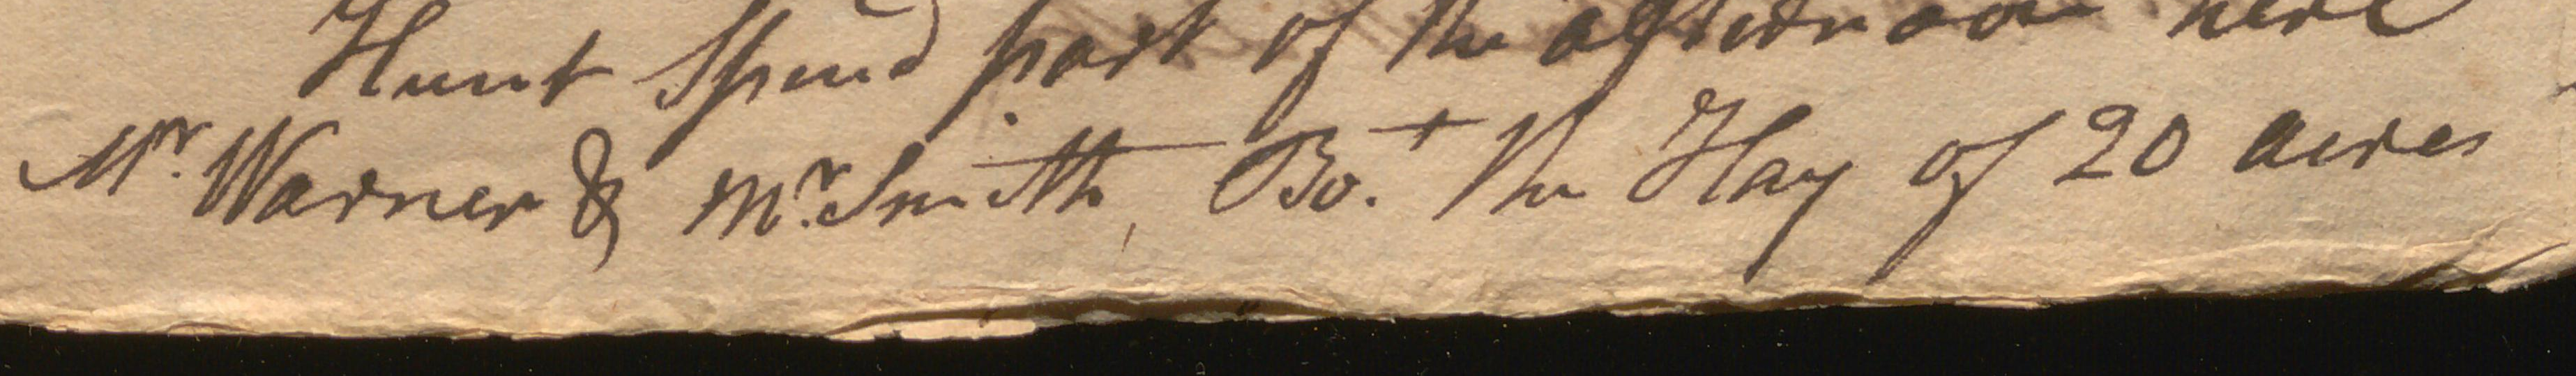M^r. Warner & M^r Smith Bo^t. the Hay of 20 acres
